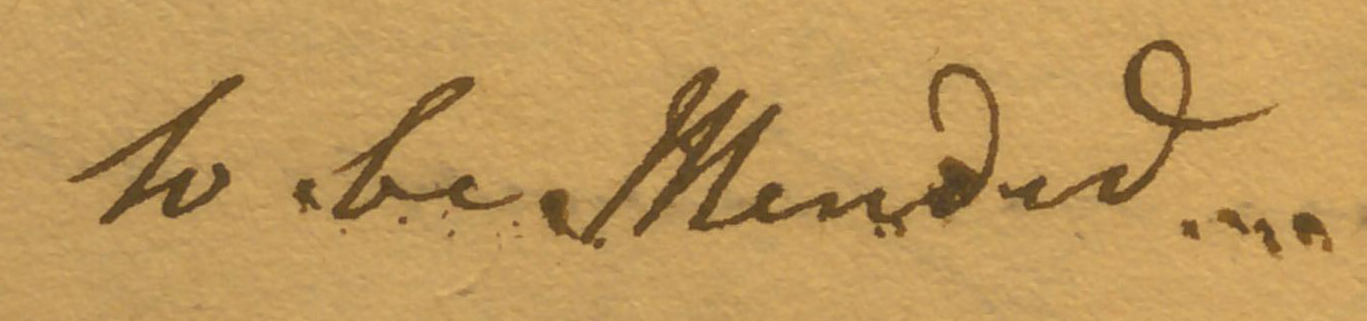to be Mended.
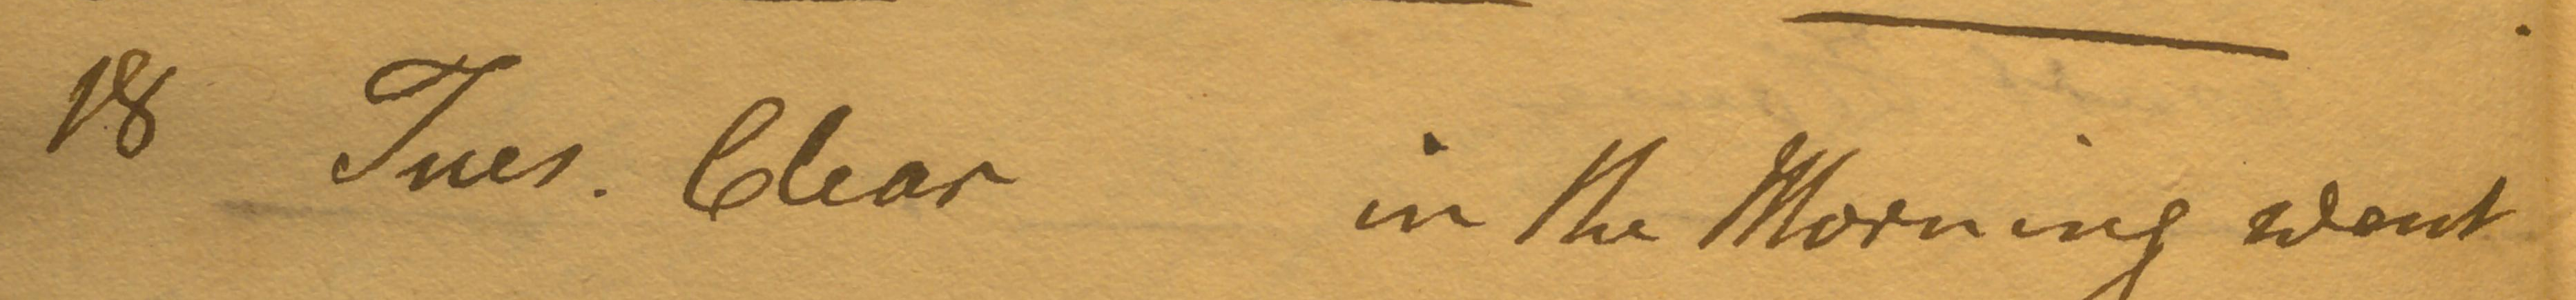18 Tues. Clear in the Morning went
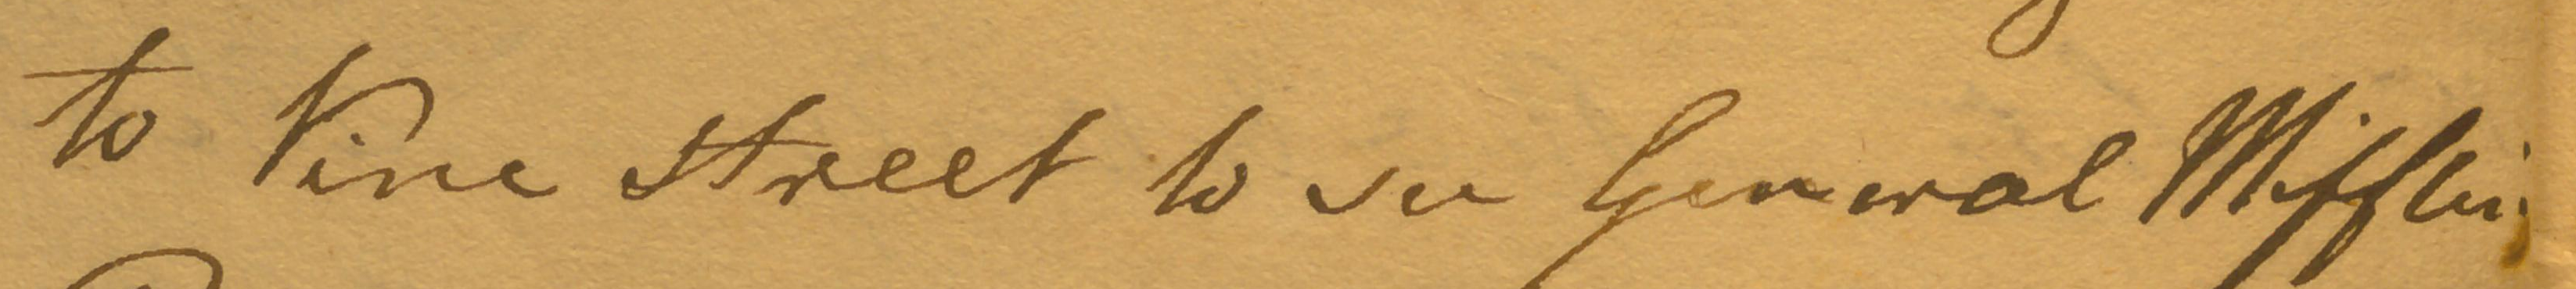to Vine street to see General Mifflin
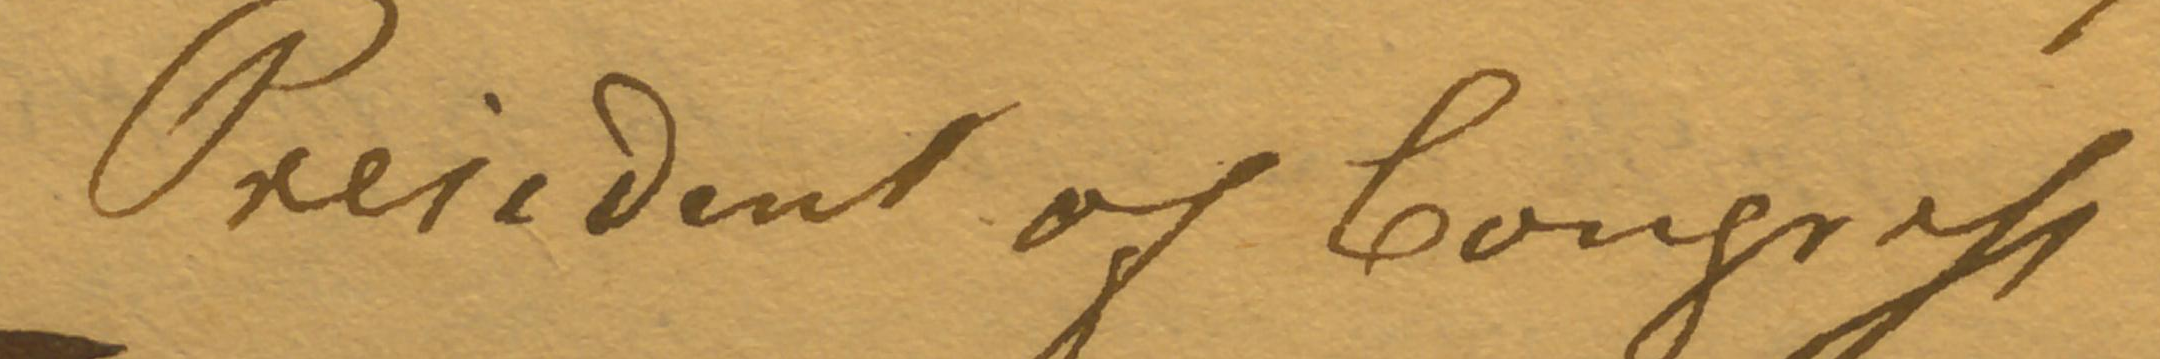President of Congress
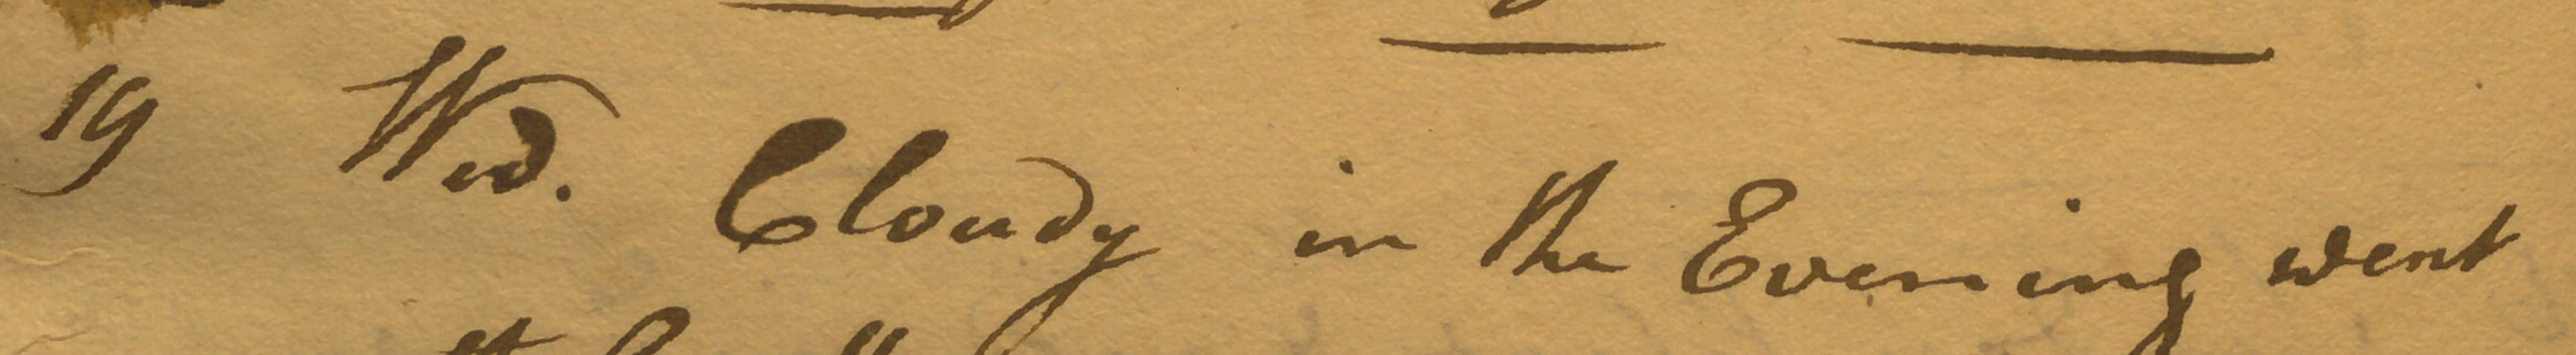19 Wed. Cloudy in the Evening went
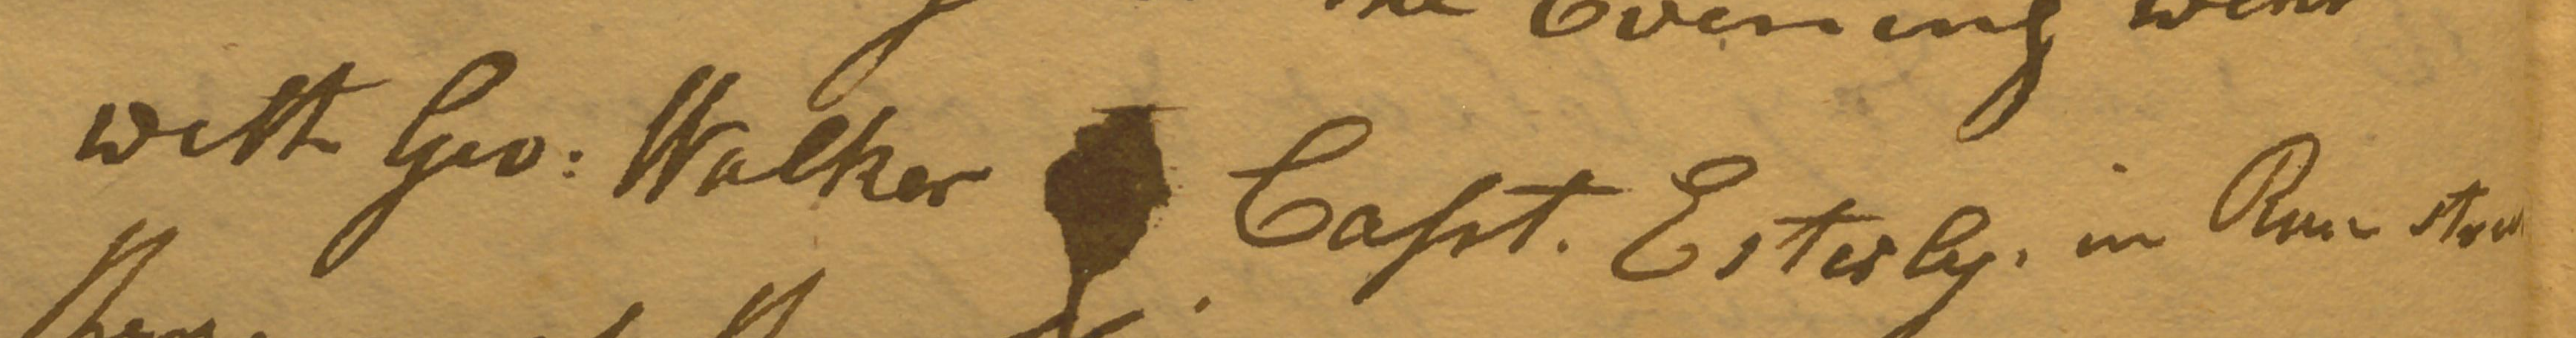with Geo. Walker [_] Capt. Esterly. in Race street
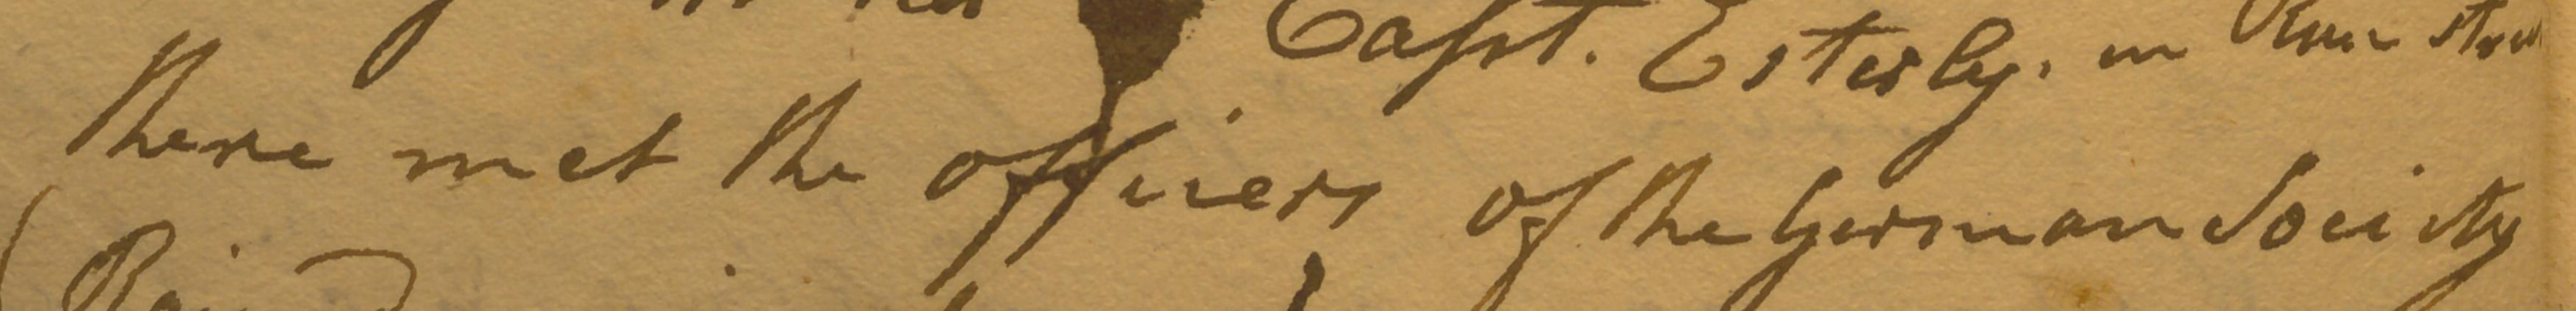there met the officers of the German Society
